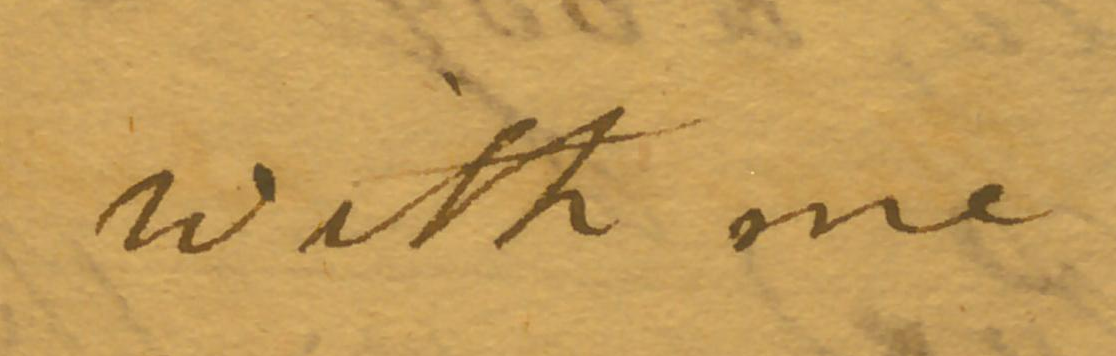with me
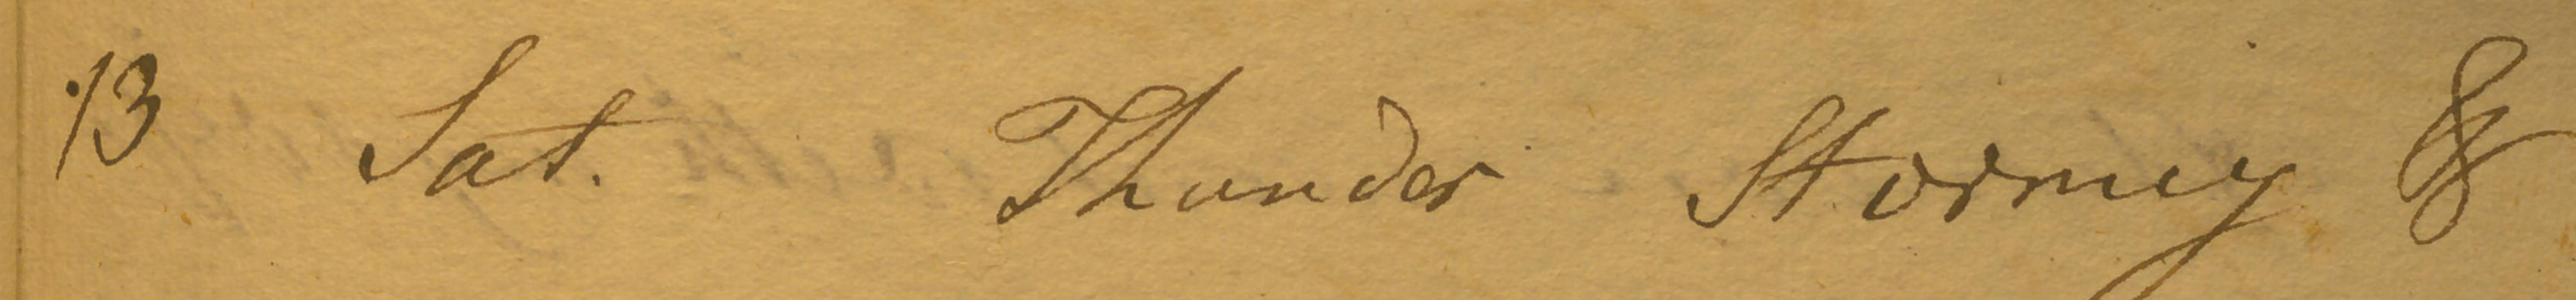13 Sat. Thunder, Stormey &
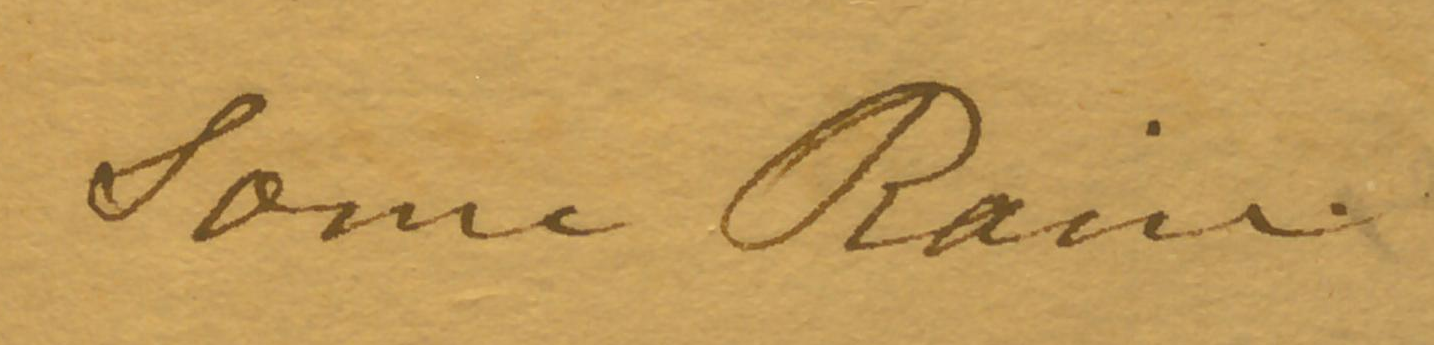some Rain
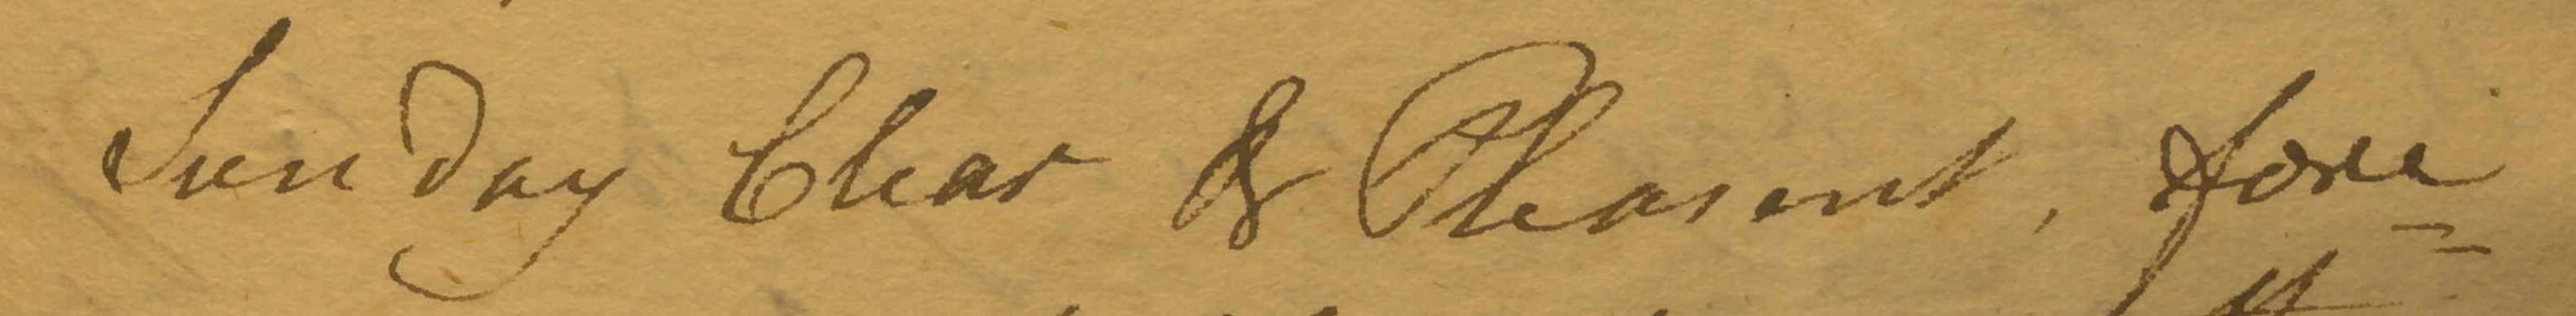Sunday Clear & Pleasent, fore
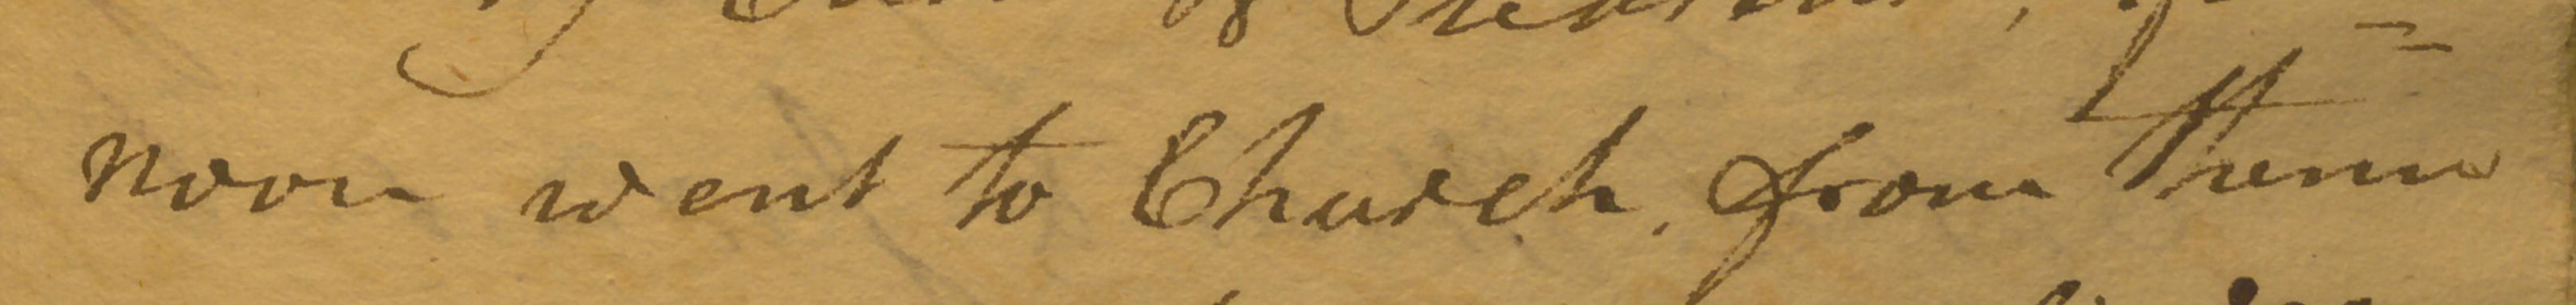noon went to Church from thence
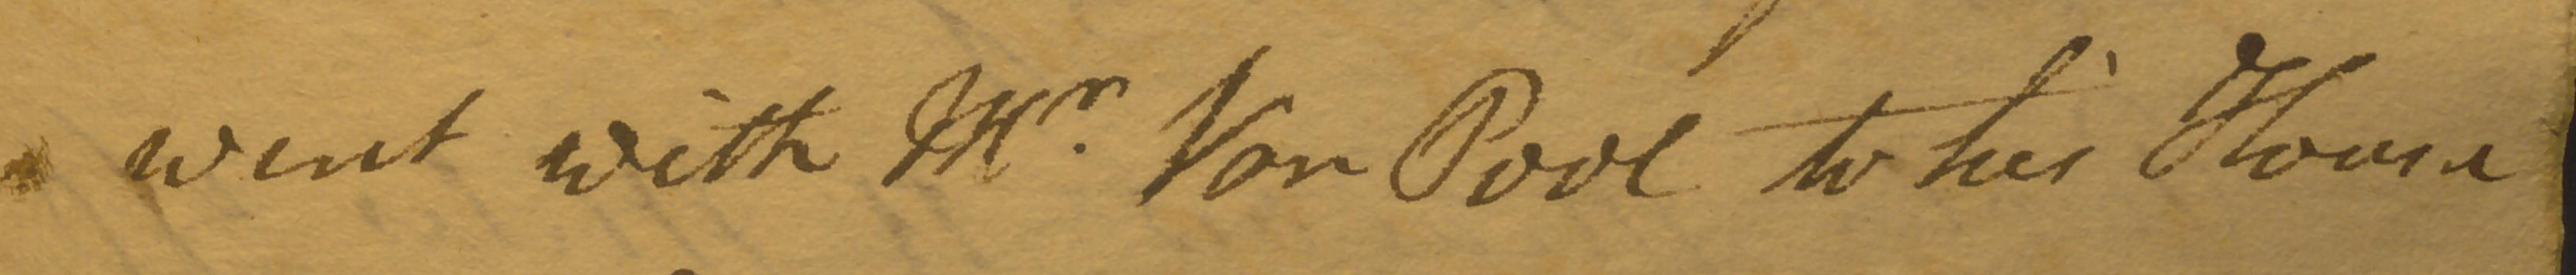went with M^r. Von Pool to his House
